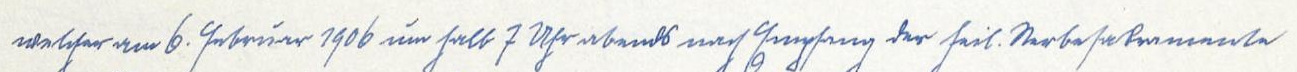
welche am 6. Februar 1906 um halb 7 Uhr abends nach Empfang der heil. Sterbesakramente
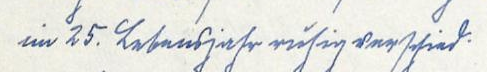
im 25. Lebensjahr ruhig verschied.
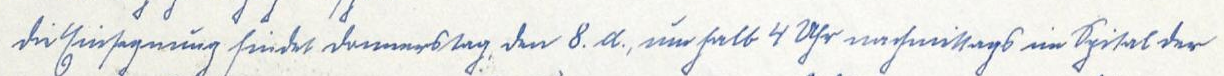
Die Einsegnung findet Donnerstag den 8. d. M., um halb 4 Uhr nachmittags im Spital der
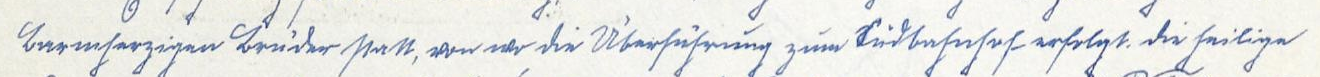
Barmherzigen Brüder statt, von wo die Überführung zum Südbahnhof erfolgt. Die heilige
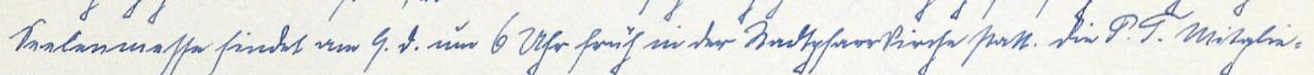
Seelenmesse findet am 9. d. M. um 6 Uhr früh in der Stadtpfarrkirche statt. Die P.P. Die Mitglie-
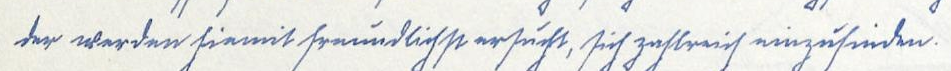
der werden hiermit freundlichst ersucht, sich zahlreich einzufinden:
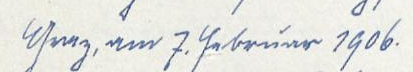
Graz, am 7. Februar 1906.
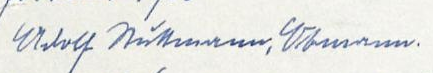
Adolf Suttmann, Obmann
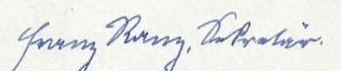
Franz Ranz, Sekretär
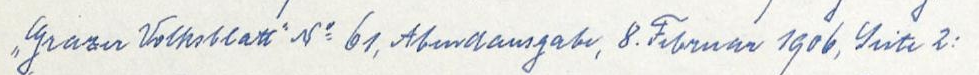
„Grazer Volksblatt“ Nr 61, Abendausgabe, 8. Februar 1906, Seite 2:
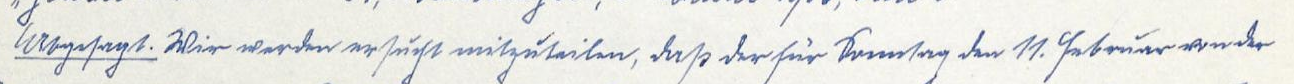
„Abgesagt. Wir werden versucht mitzuteilen, daß der für Sonntag den 11. Februar von der
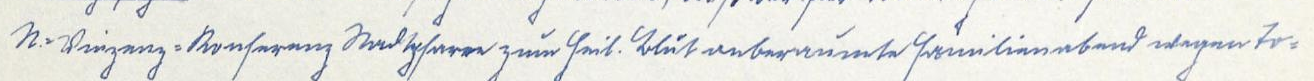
St. Vinzenz-Konferenz Stadtpfarre zum heil. Blut anberaumte Familienabend wegen To-
